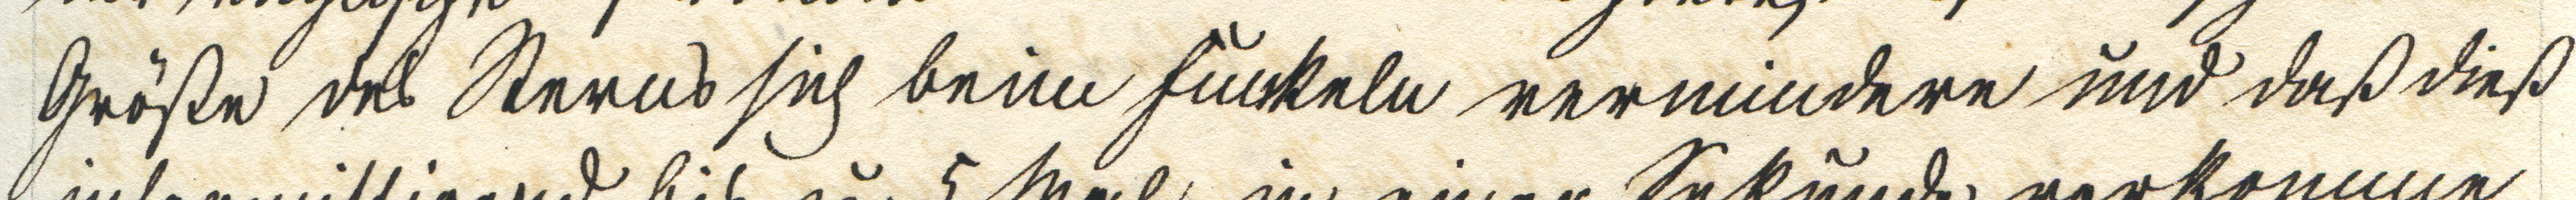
Größe des Sterns sich beim Funkeln vermindere und daß dieß
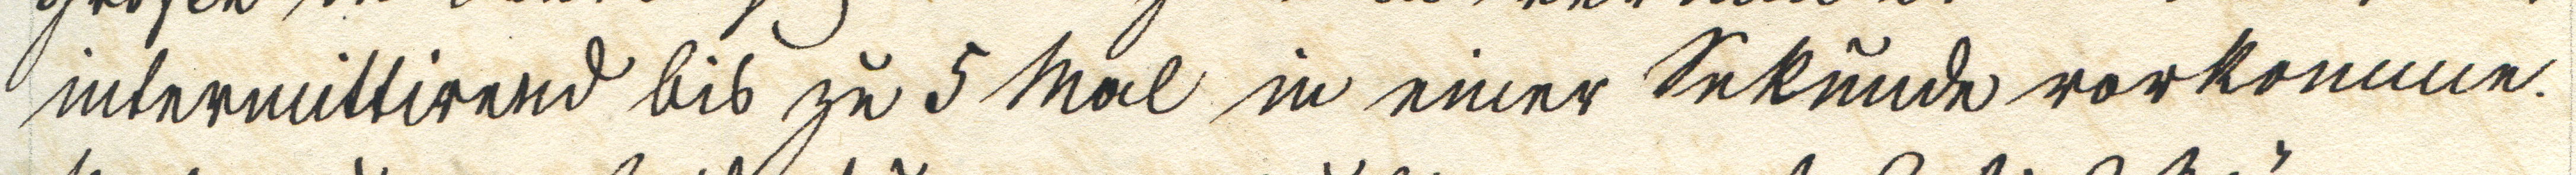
intermittirend bis zu 5 Mal in einer Sekunde vorkomme.
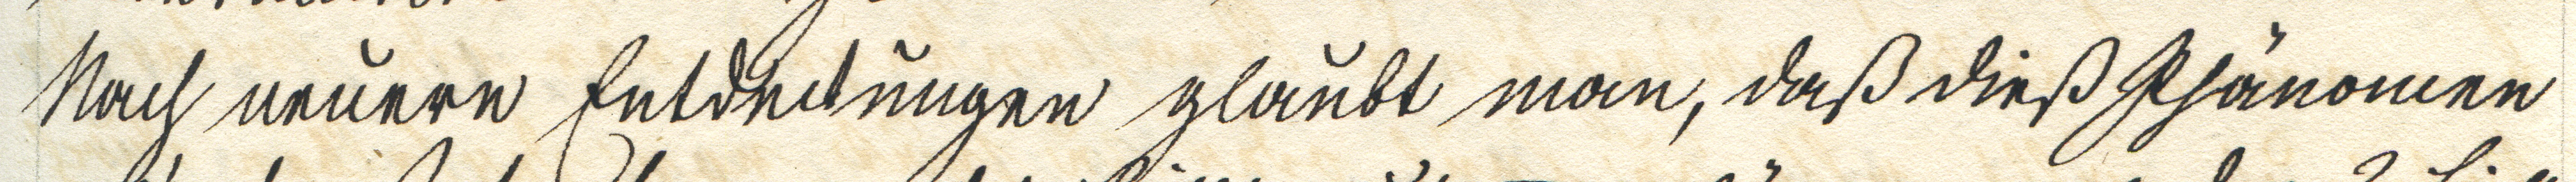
Nach neuern Entdeckungen glaubt man, daß dieß Phänomen
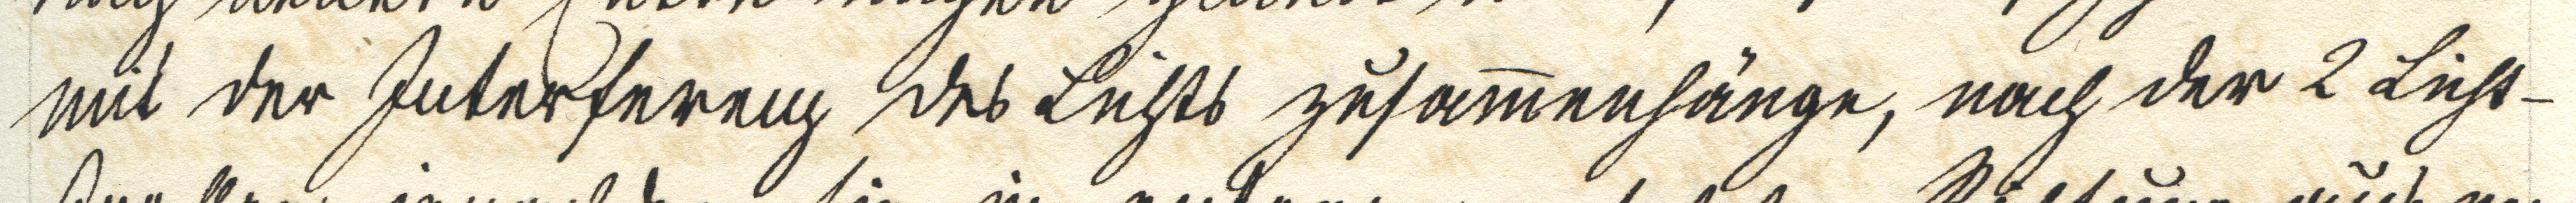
mit der Interferenz des Lichts zusam̃enhänge, nach der 2 Licht-
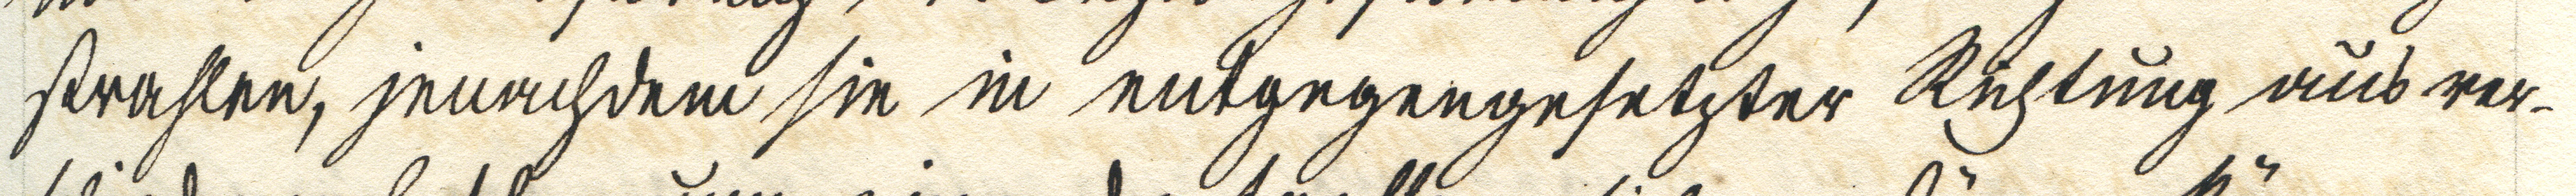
strahlen, jenachdem sie in entgegengesetzter Richtung aus ver-
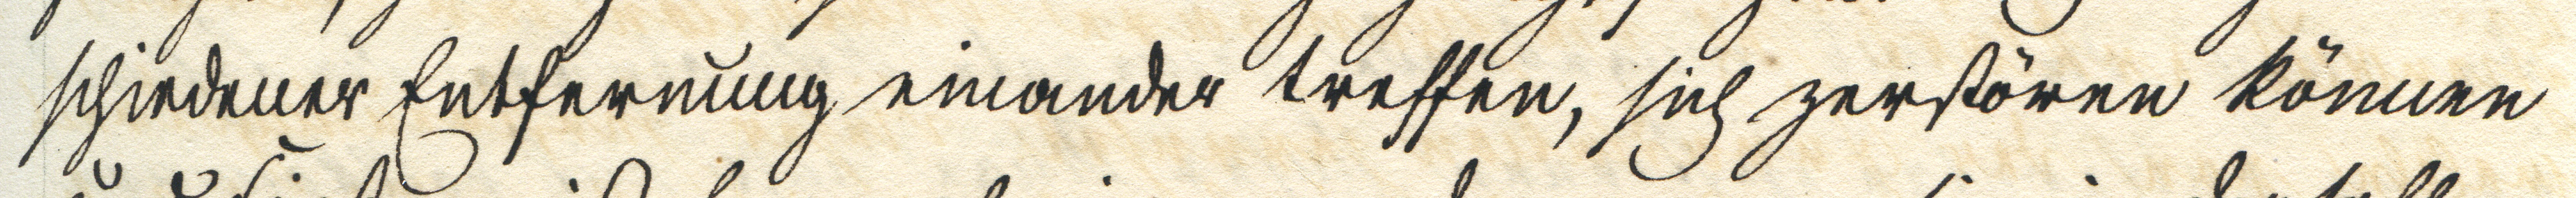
schiedener Entfernung einander treffen, sich zerstören können
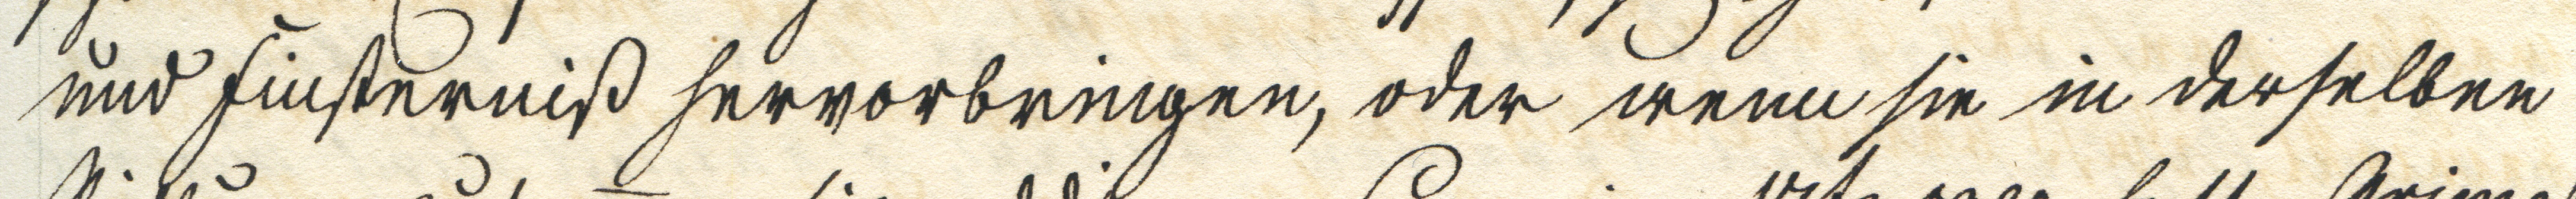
und Finsterniß hervorbringen, oder wenn sie in derselben
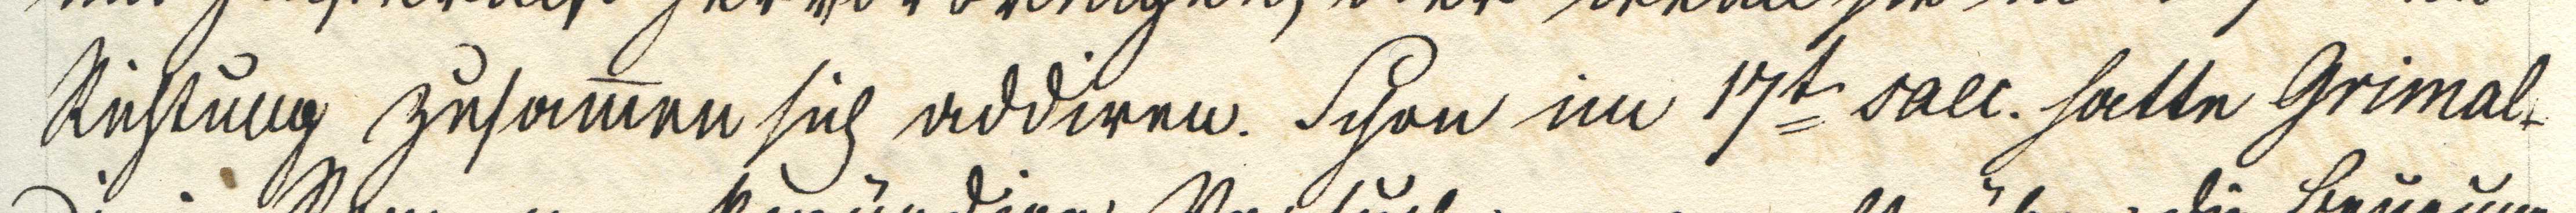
Richtung zusam̃en sich addiren. Schon im 17t saec. hatte Grimal-
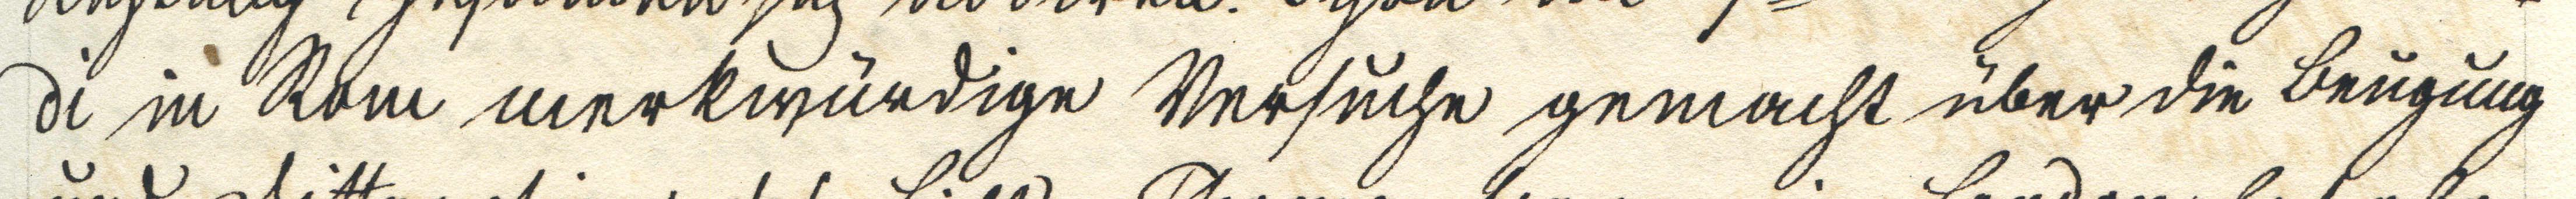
di in Rom merkwürdige Versuche gemacht über die Beugung
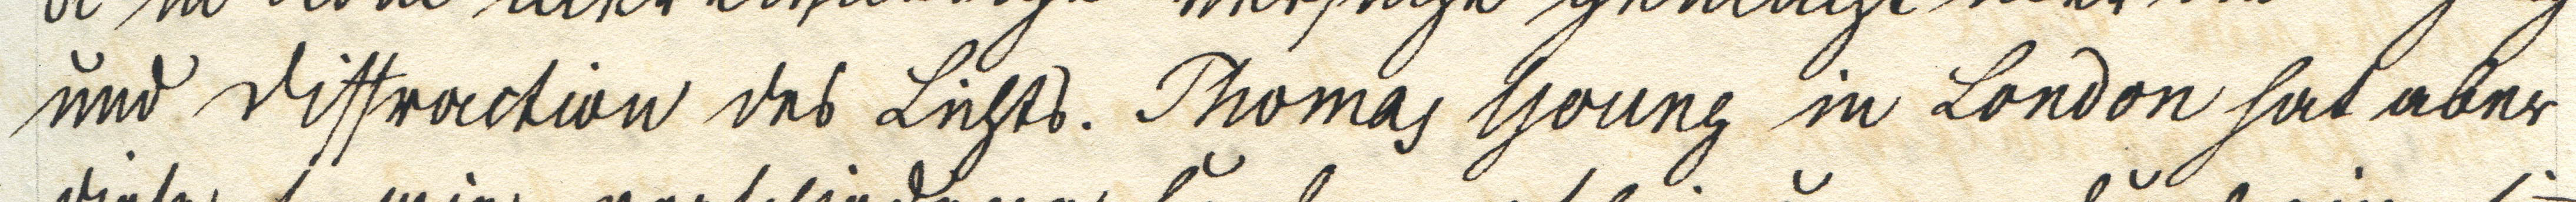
und Diffraction des Lichts. Thomas Young in London hat aber
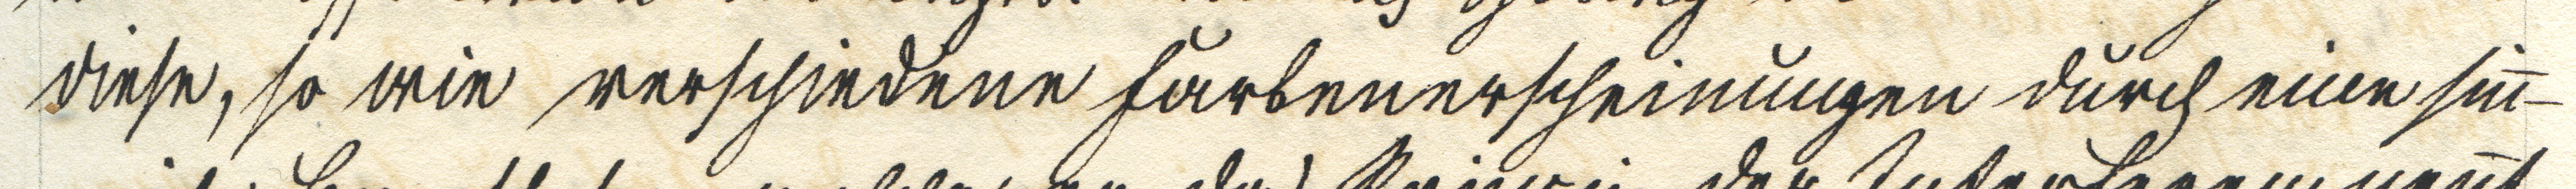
diese, so wie verschiedene Farbenerscheinungen durch eine siñ-
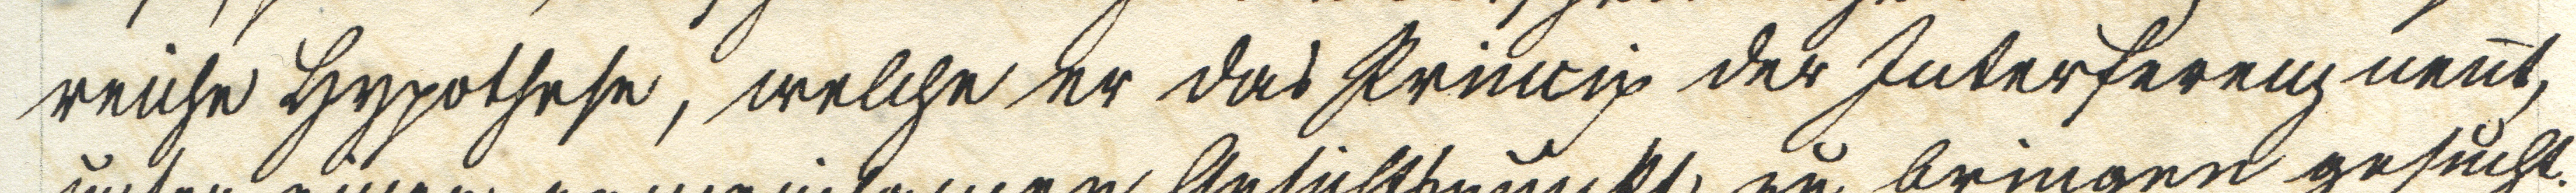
reiche Hypothese, welche er das Princip der Interferenz neñt,
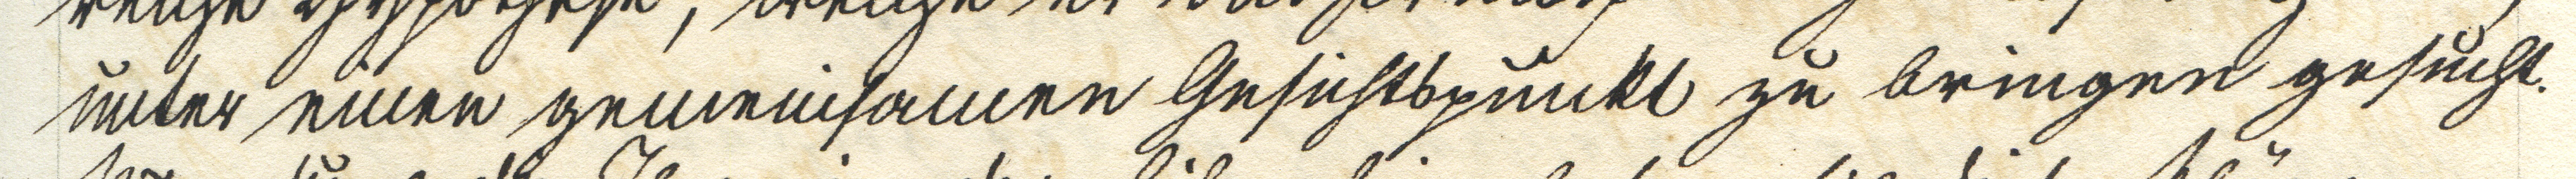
unter einen gemeinsamen Gesichtspunkt zu bringen gesucht.
